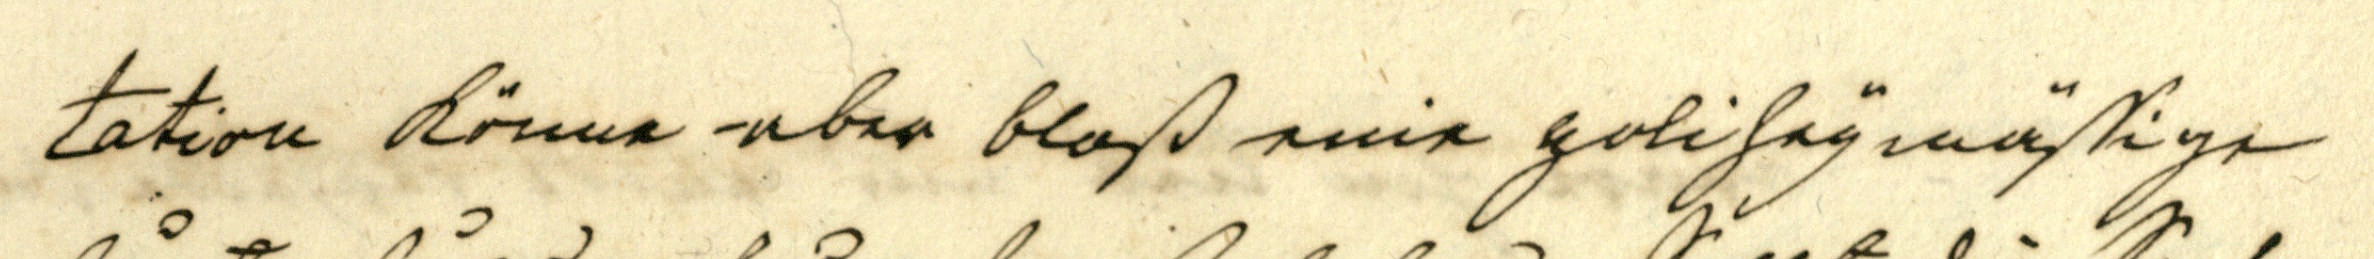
tation könne aber bloß eine polizeÿ mässige
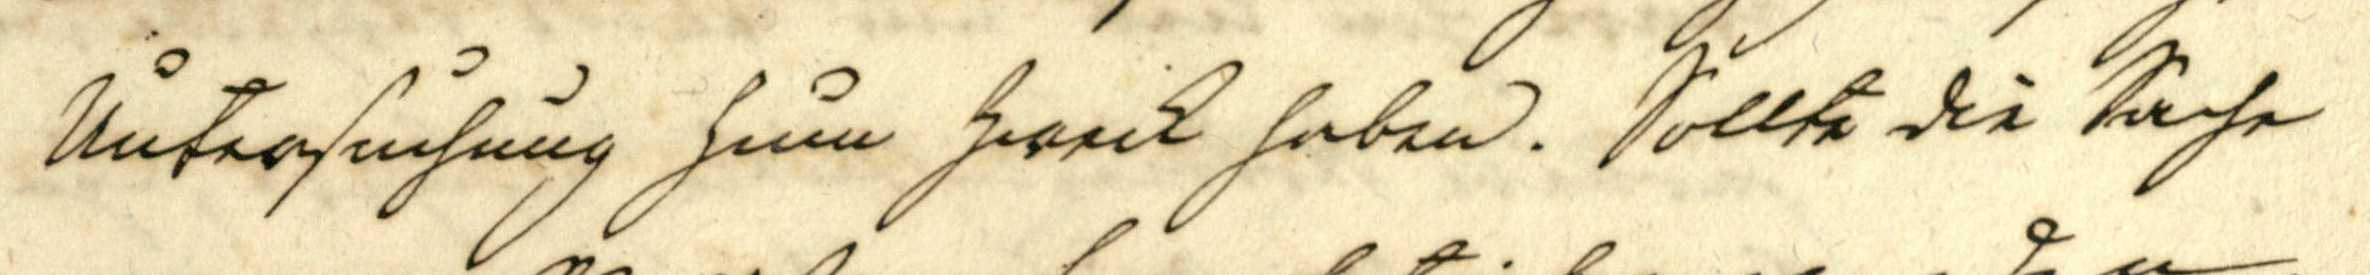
Untersuchung zum Zweck haben. Sollte die Sache
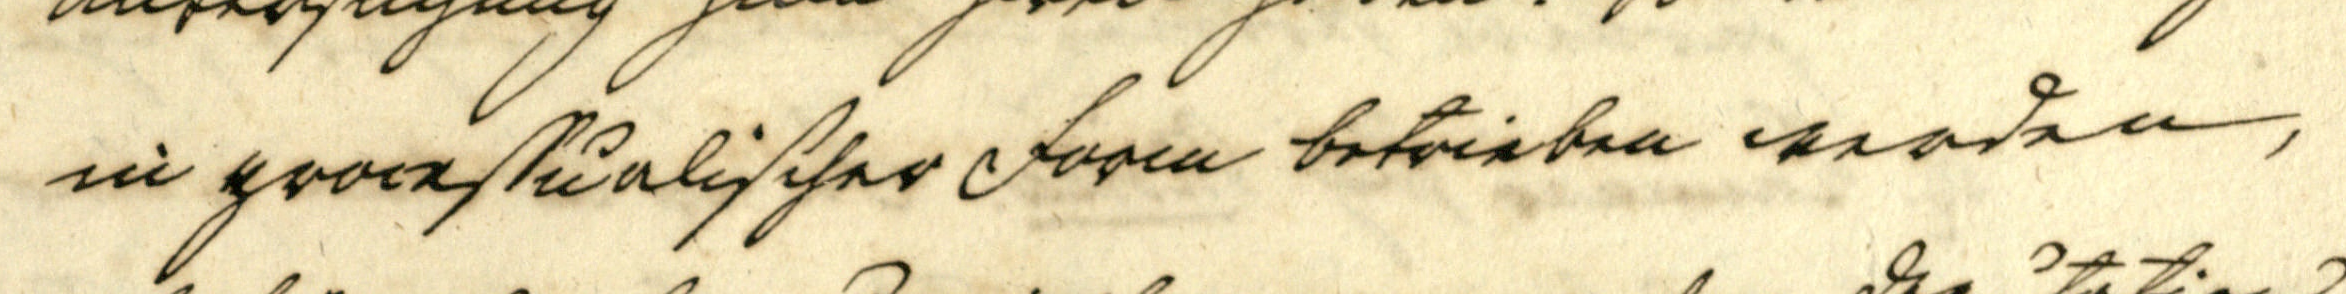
in processualischer Form betrieben werden,
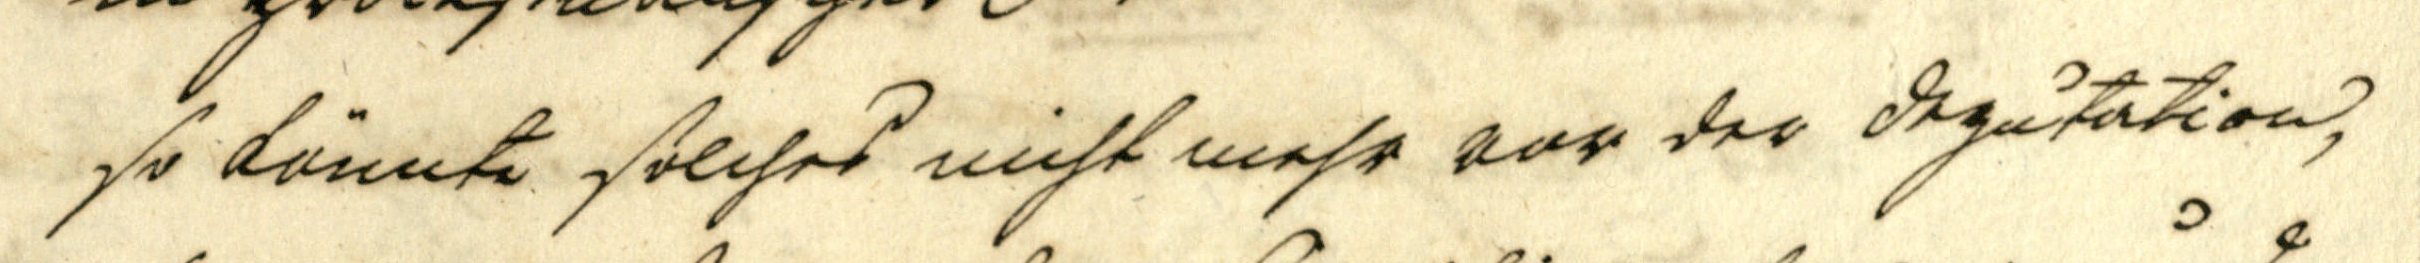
so könnte solches nicht mehr vor der Deputation,
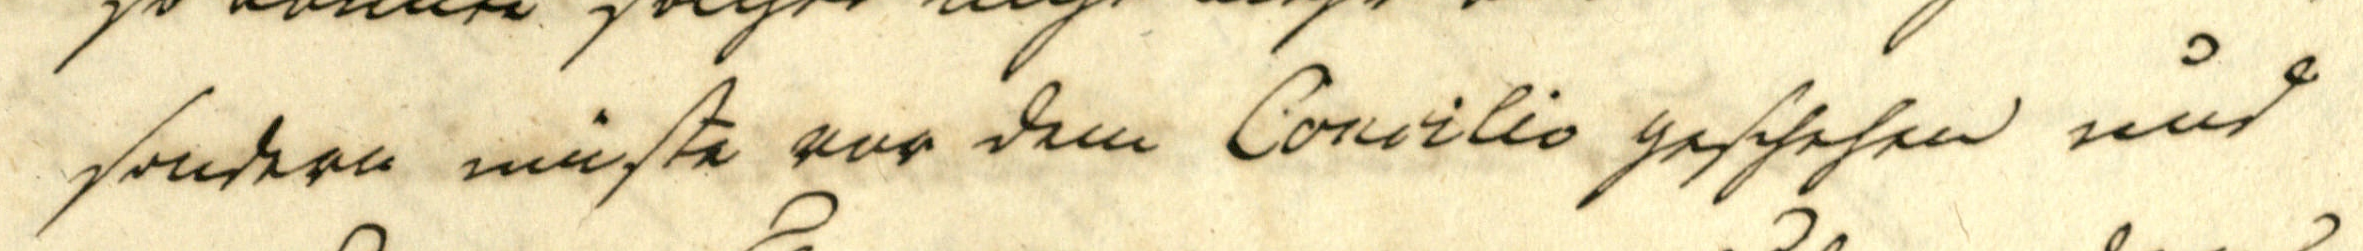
sondern müßte vor dem Concilio geschehen und
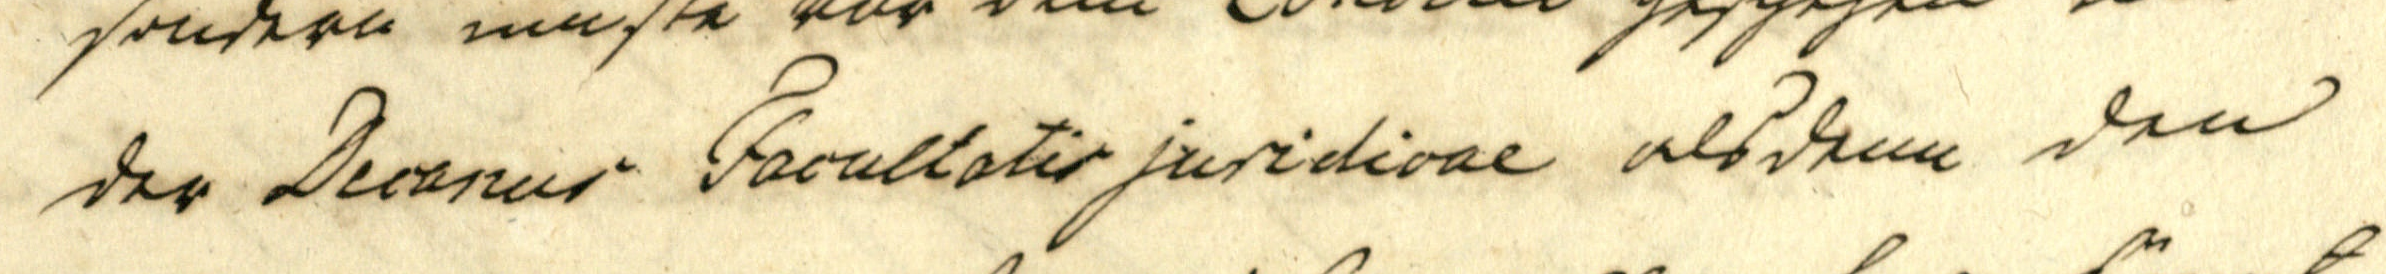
der Decanus Facultatis juridicae alsdenn den
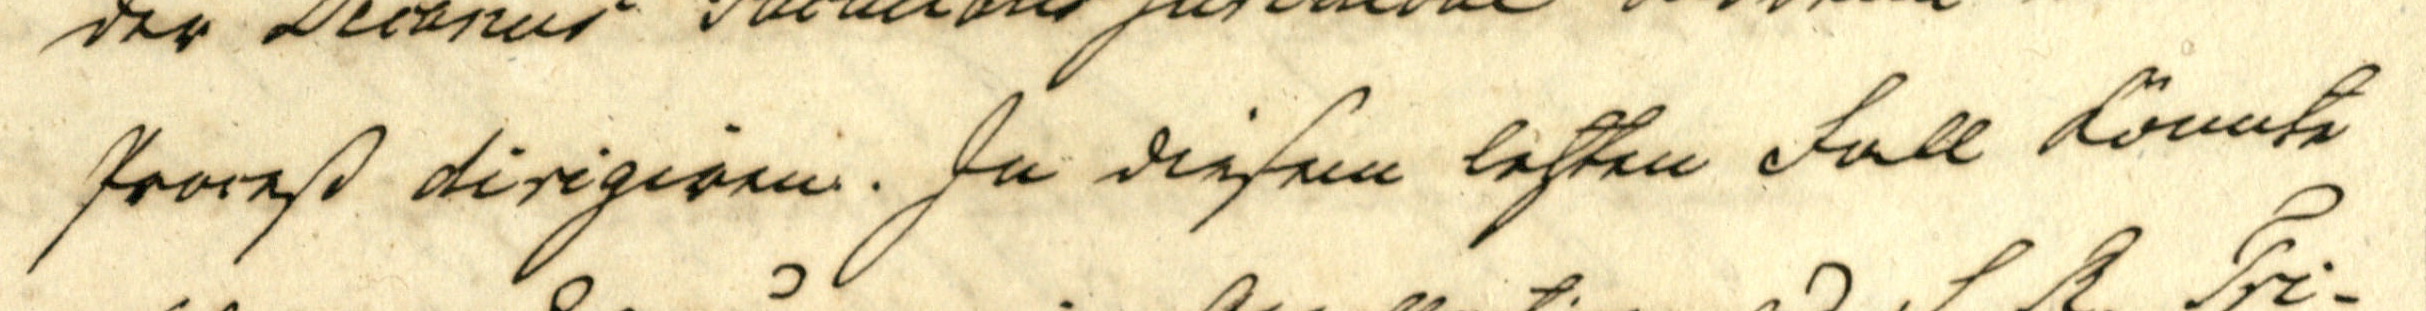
Proceß dirigiren. In diesem letzten Fall könnte
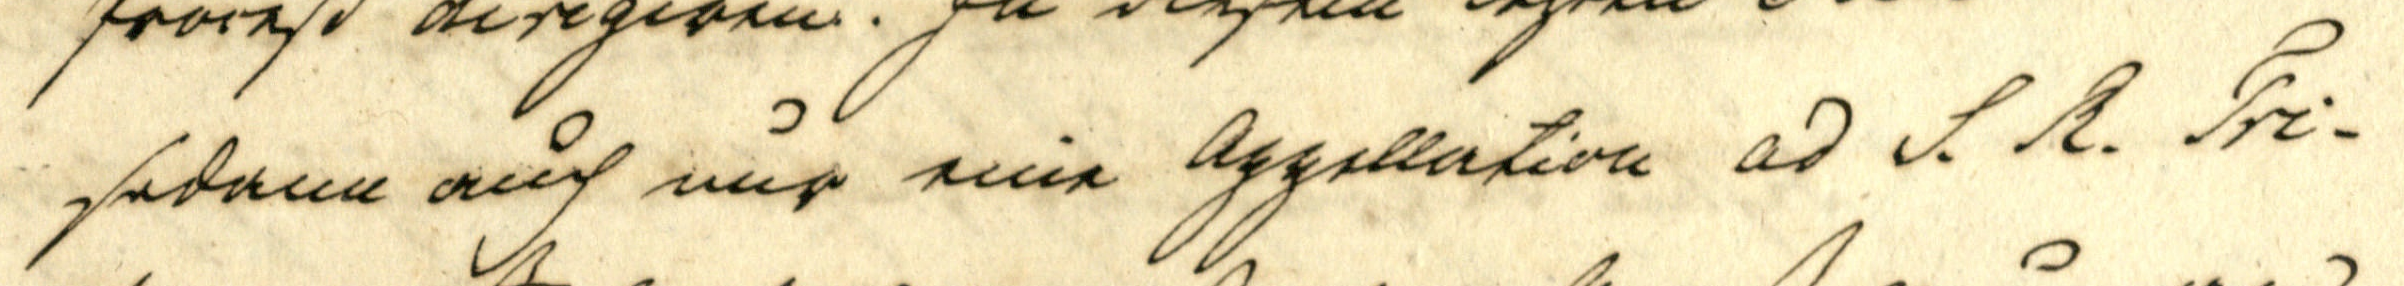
sodann auch nur eine Appellation ad S. K. Tri¬
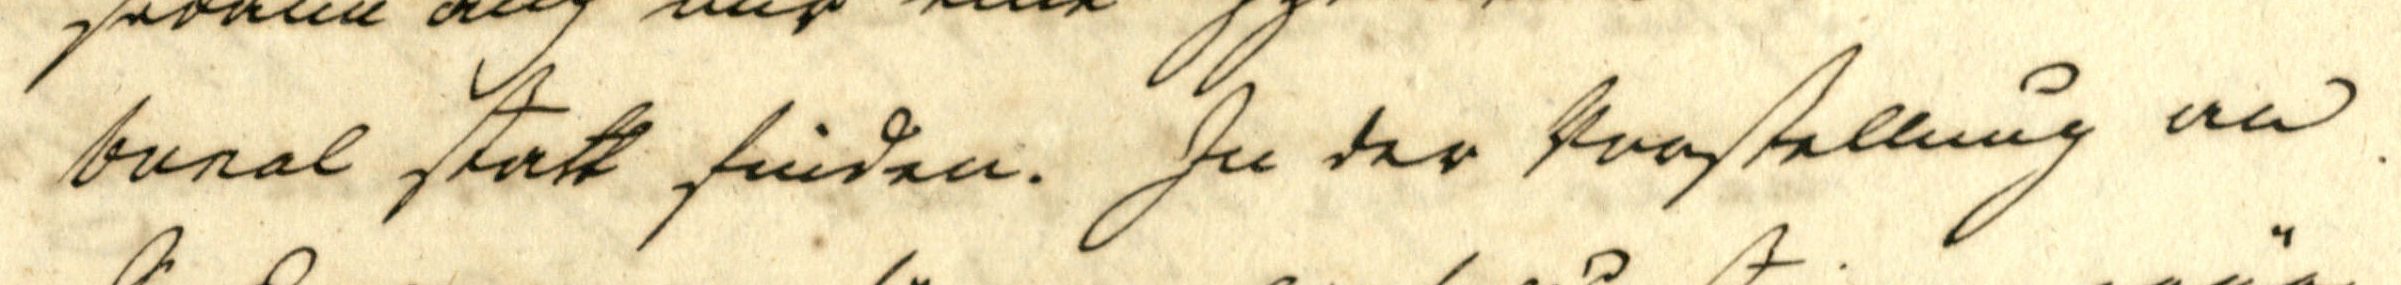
bunal statt finden. In der Vorstellung an
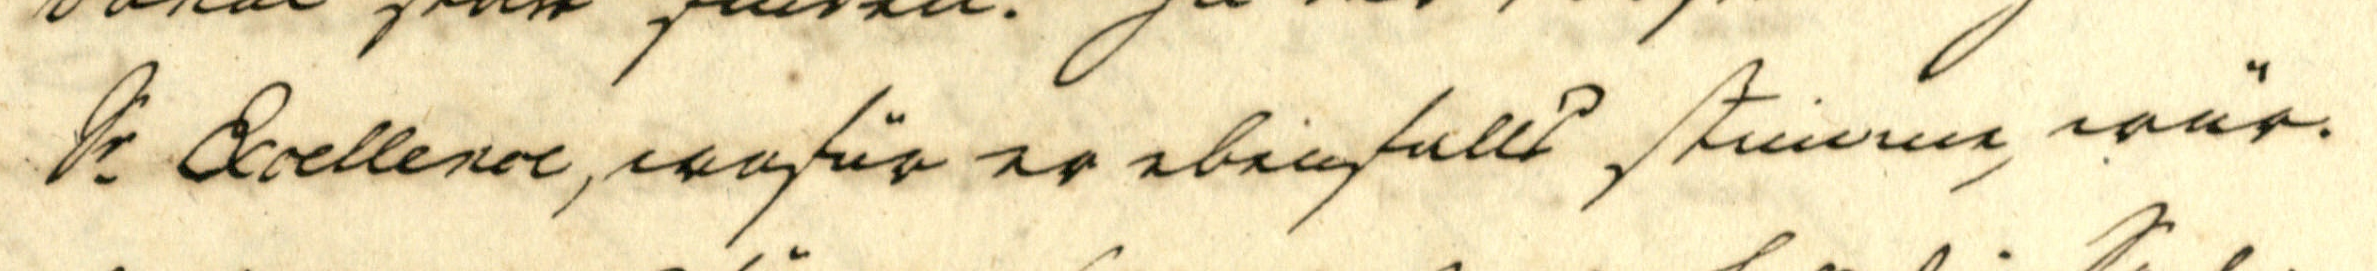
Sr Excellence, wofür er ebenfalls stimme, wür¬
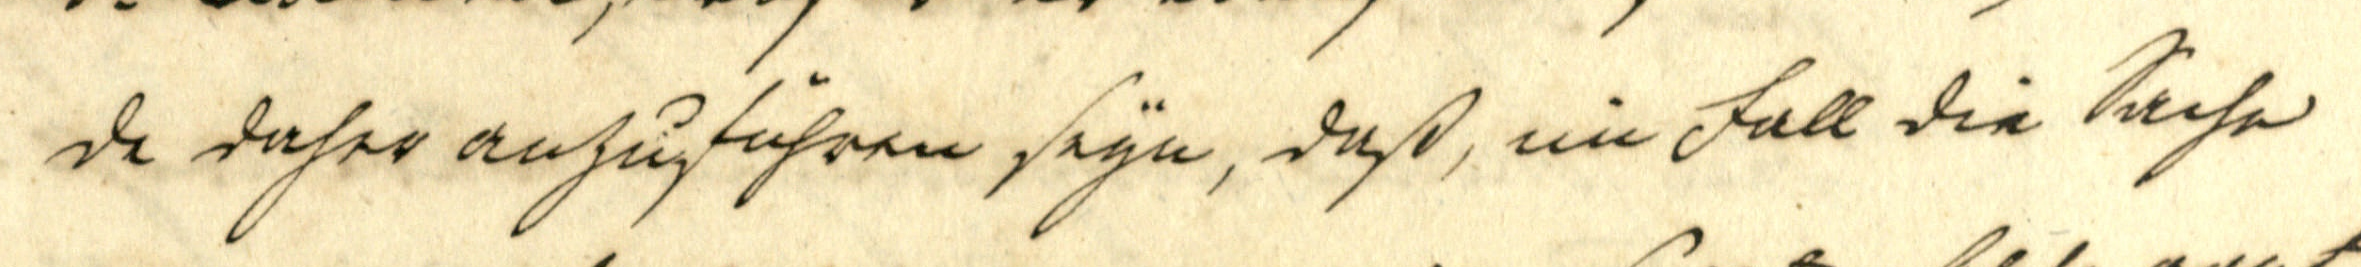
de daher anzuführen seÿn, daß, im Fall die Sache
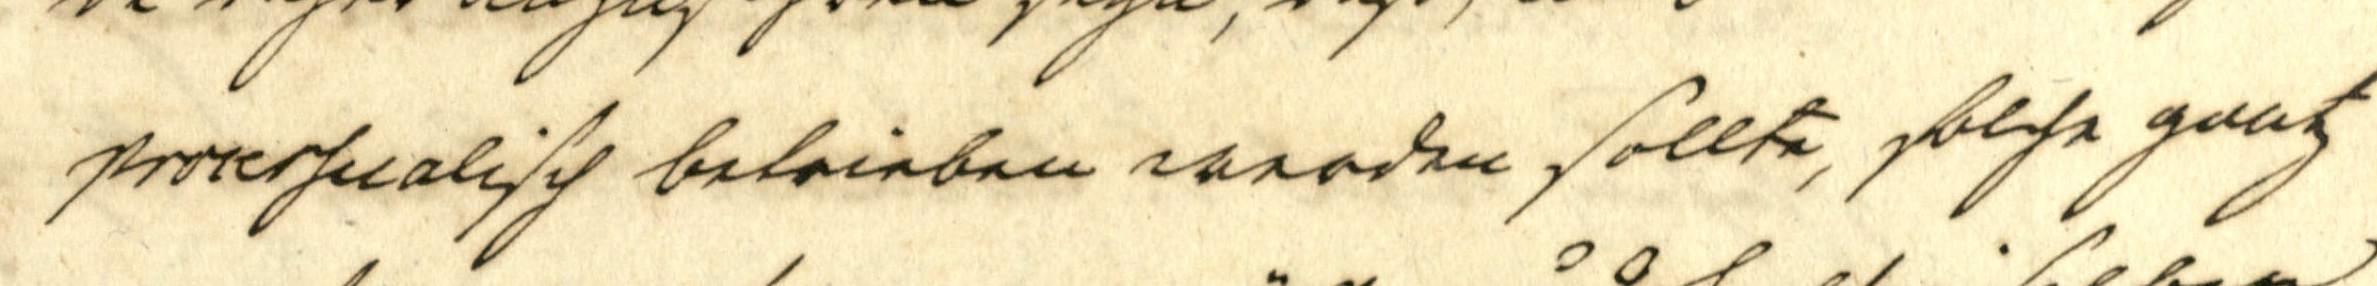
processualisch betrieben werden sollte, solche gantz
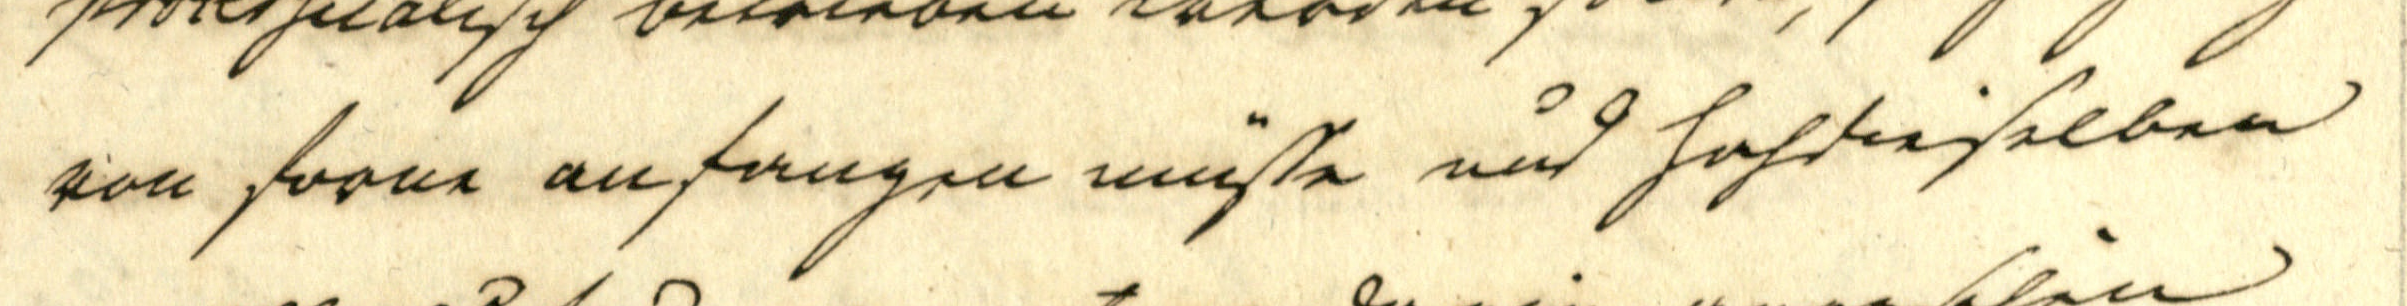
von forne anfangen müsse und hochdieselben
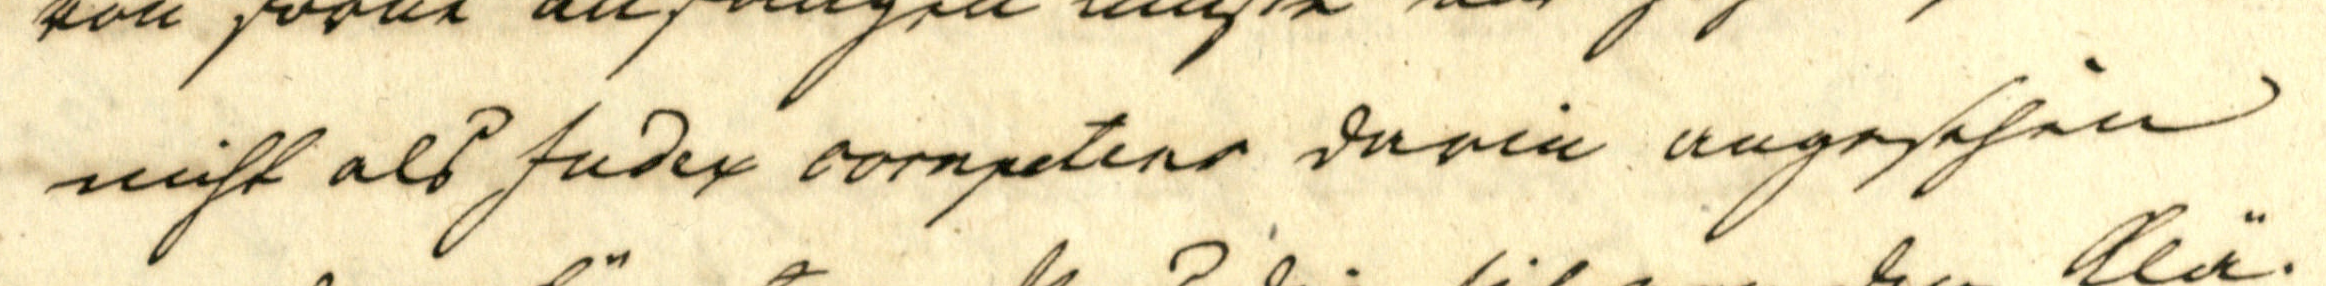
nicht als Index competens darin angesehen
